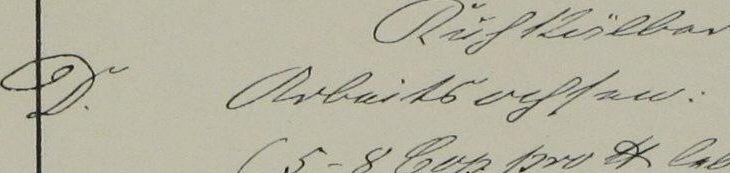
D. Arbeitsochsen:
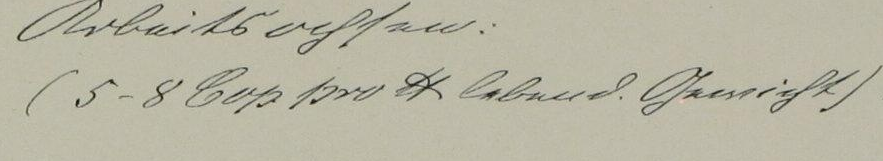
(5-8 Cop. pro lb lebend. Gewicht)
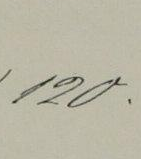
120
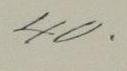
40
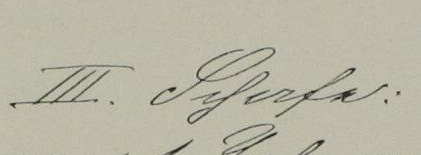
III. Schafe:
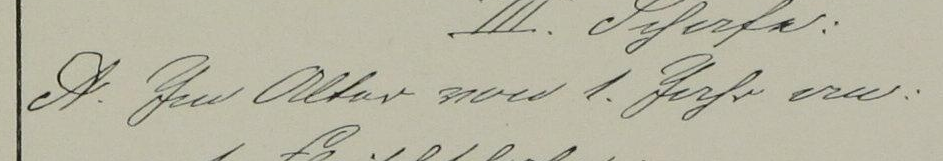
A. Im Alter von 1 Jahr an:
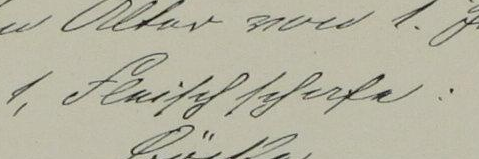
1. Fleischschafe:
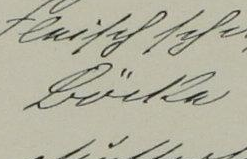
Böcke
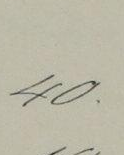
40
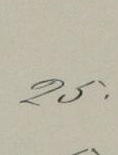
25
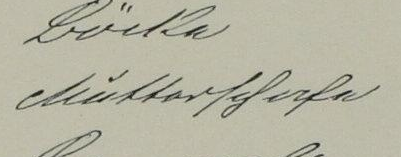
Mutterschafe
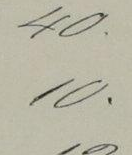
10
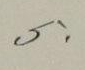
5
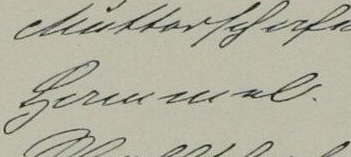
Hammel
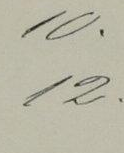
10
